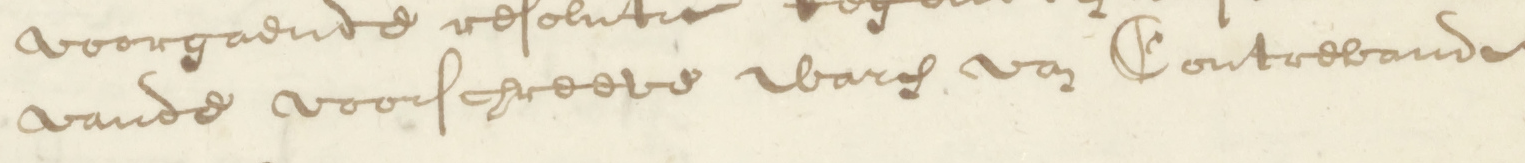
vande voorschreeve waren van Contrebande
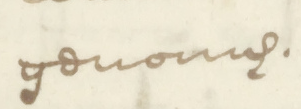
genomen.
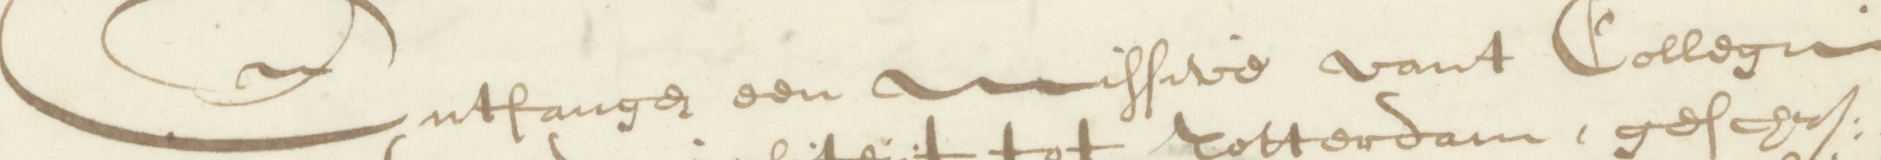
Ontfangen een Missive vant Collegie
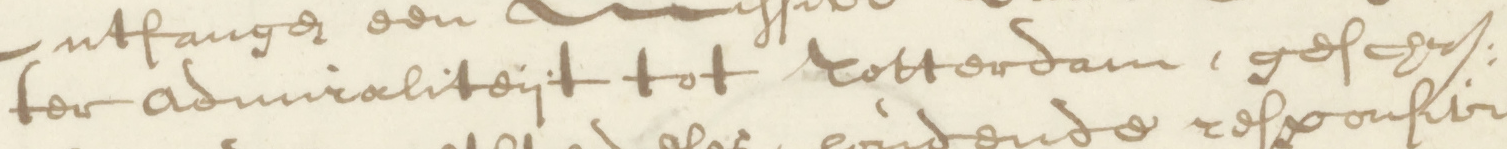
ter Admiraliteijt tot Rotterdam, geschr:
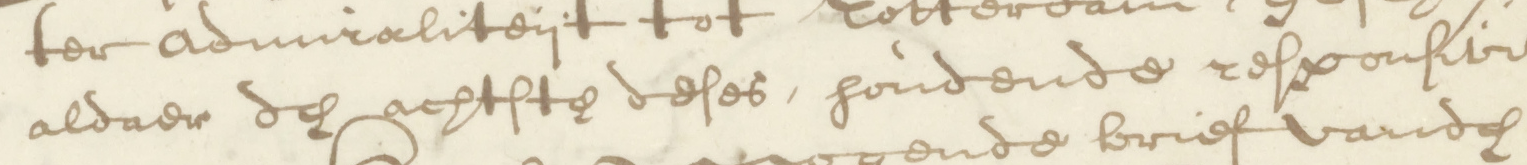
aldaer den achtsten deses, houdende responsive
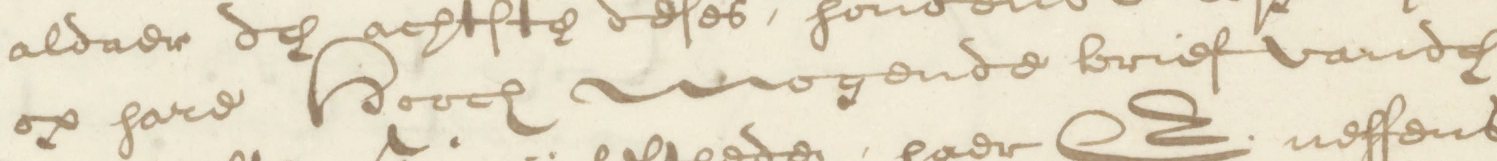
op hare Hooch Mogende brief vanden
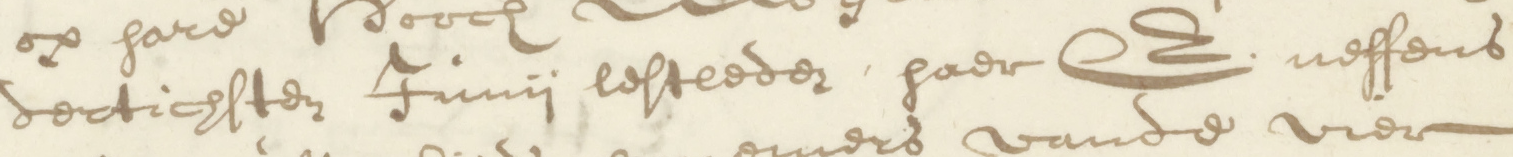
dertichsten Junij lestleden, haer E. neffens
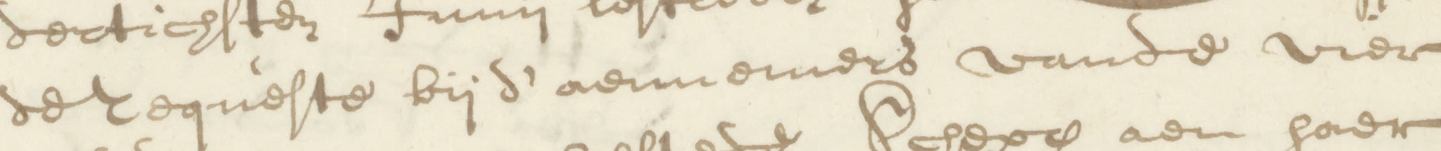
de requeste bij d‛aennemers vande vier
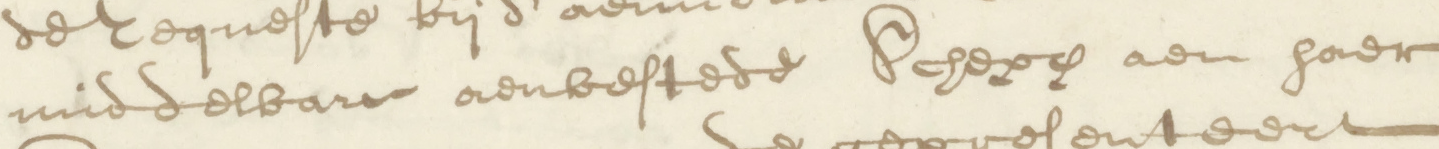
middelbare aenbestede Schepen aen haer
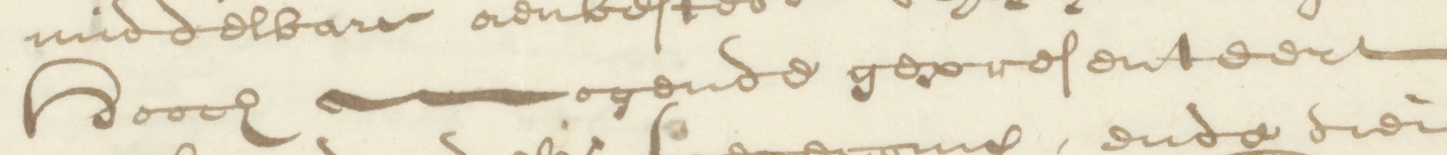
Hooch Mogende gepresenteert
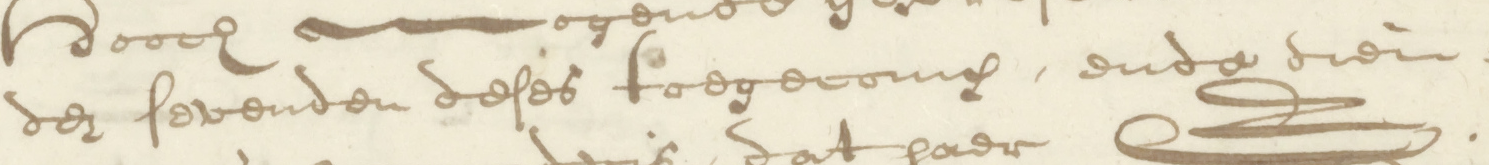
den sevenden deses toegecomen, ende dien=
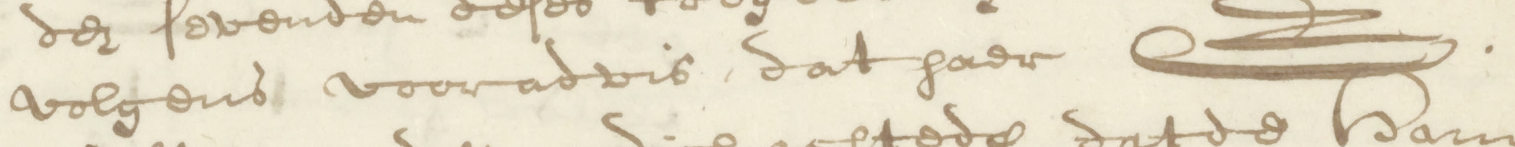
volgens voor advis, dat haer E.
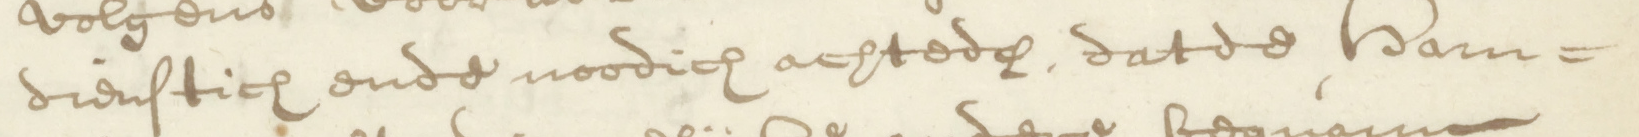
dienstich ende noodich achteden dat de Ham=
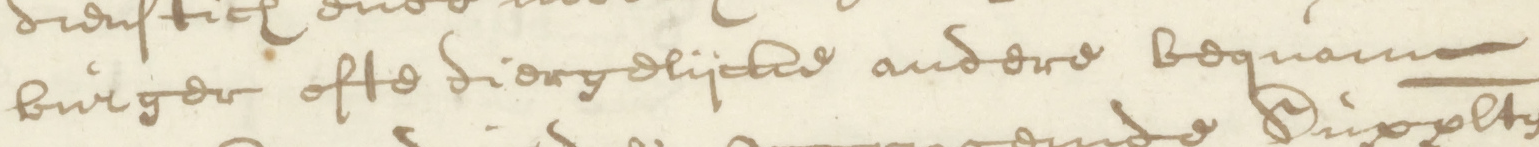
burger ofte diergelijcke andere bequame
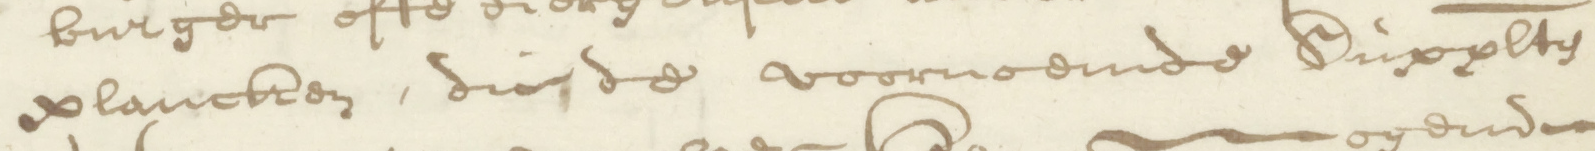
plancken, die de voornoemde Supplten
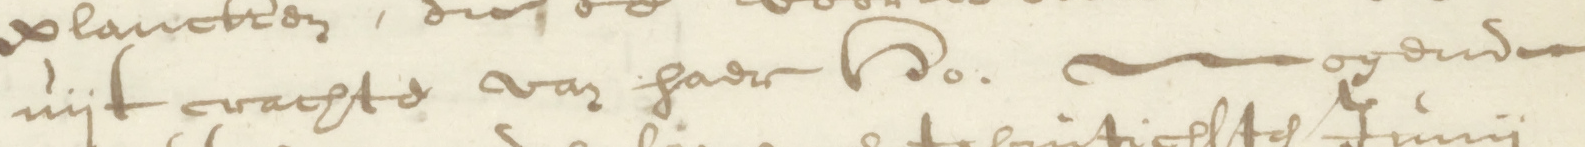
uijt crachte van haer Ho. Mogende
